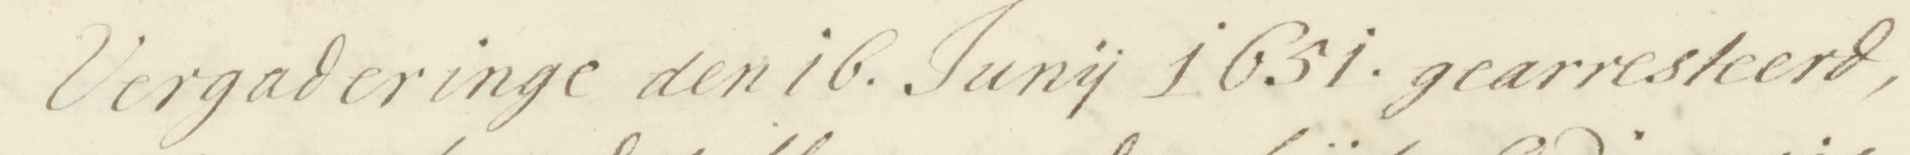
Vergaderinge den 16. Junij 1651. gearresteert,
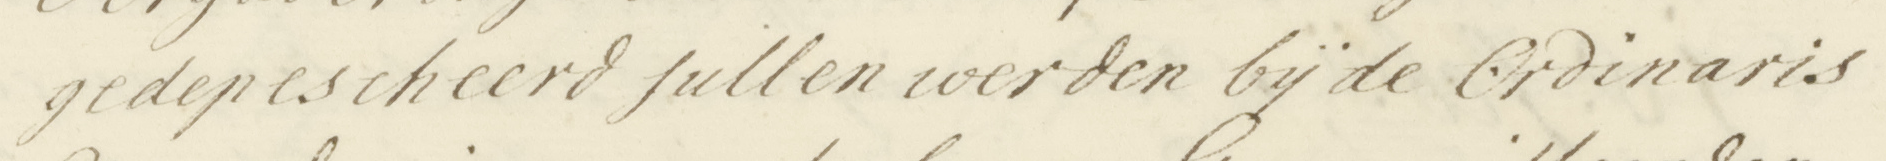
gedepescheert sullen werden bij de Ordinaris
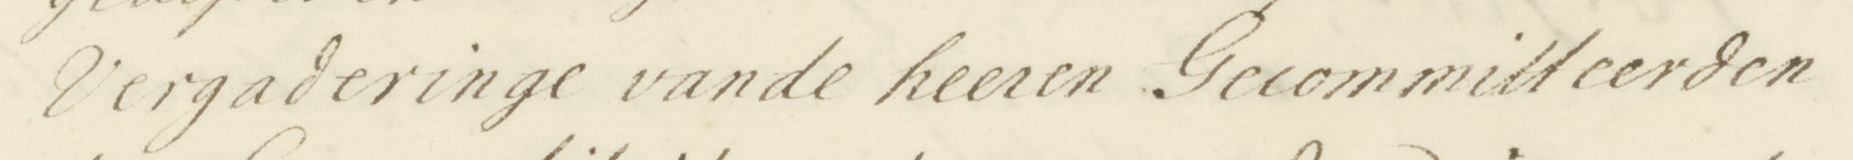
Vergaderinge van de heeren Gecommitteerden
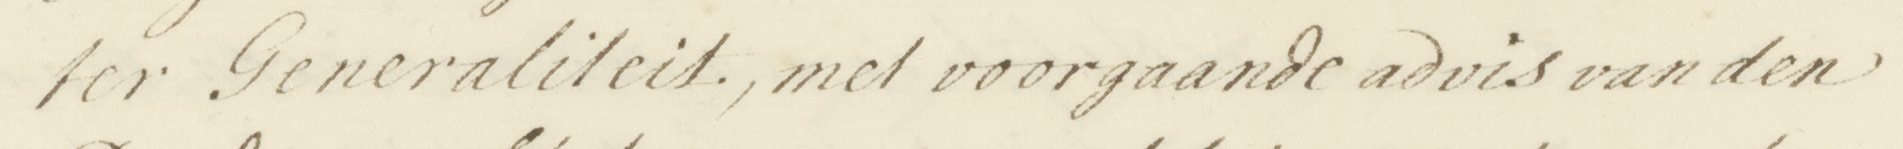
ter Generaliteit, met voorgaande advis van den
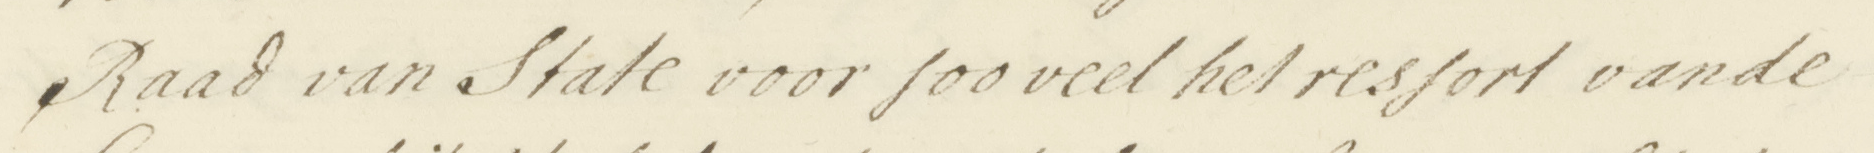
Raad van State voor soo veel het ressort vande
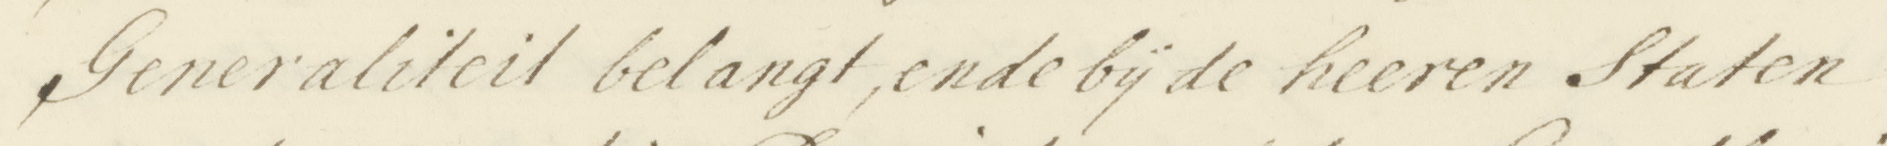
Generaliteit belangt, ende bij de heeren Staten
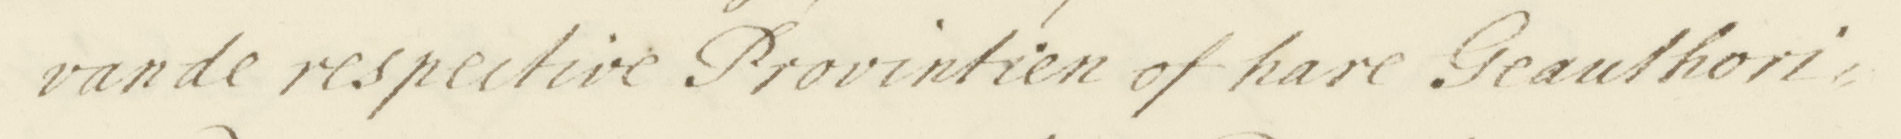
van de respective Provintien of hare Geauthori,
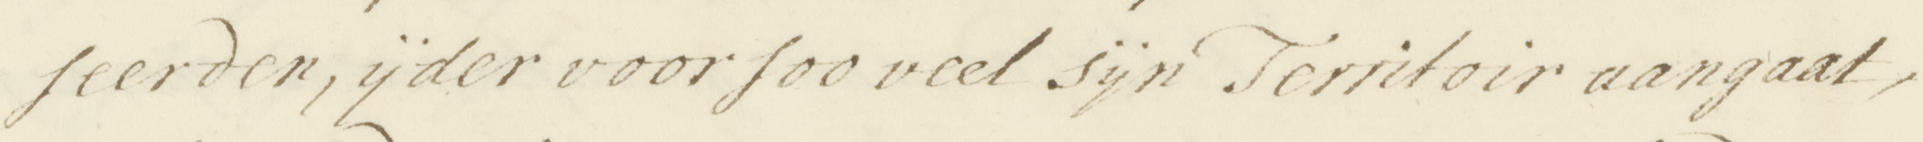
seerden, ijder voor soo veel sijn Territoir aangaat,
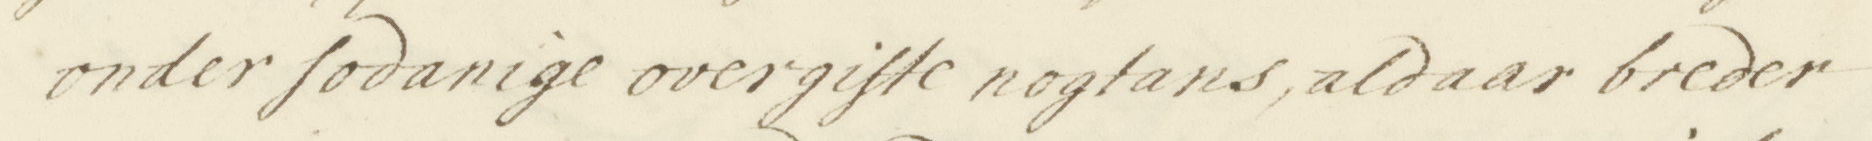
onder sodanige overgifte nogtans, aldaar breder
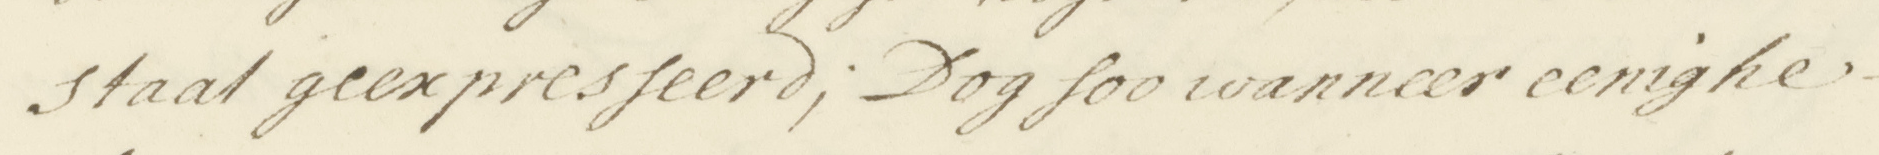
staat geexpresseerd; Dog soo wanneer eenighe
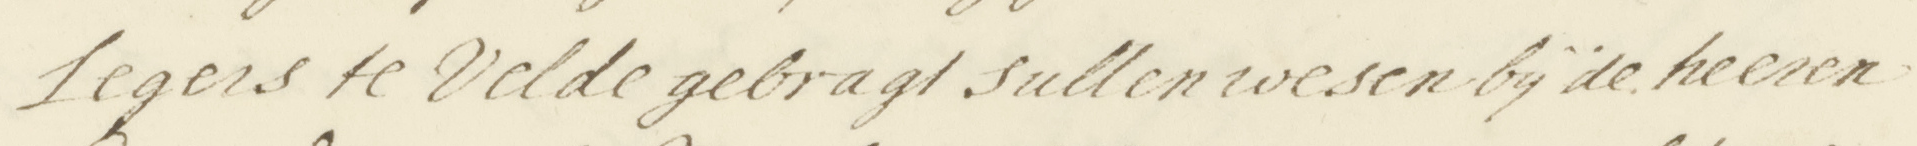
legers te velde gebragt sullen wesen bij de heeren
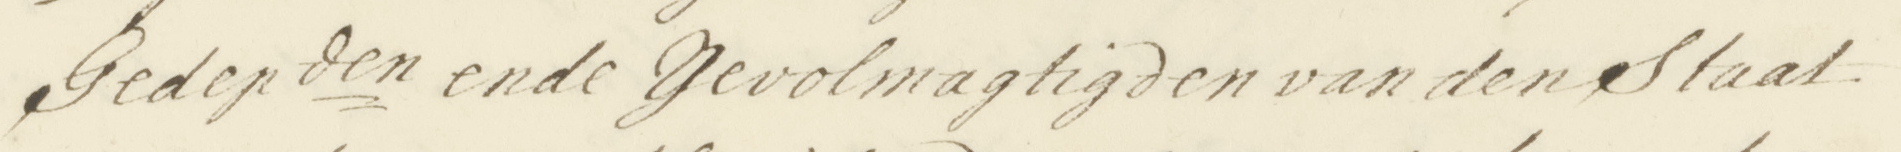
Gedepden ende Gevolmagtigden van den Staat,,
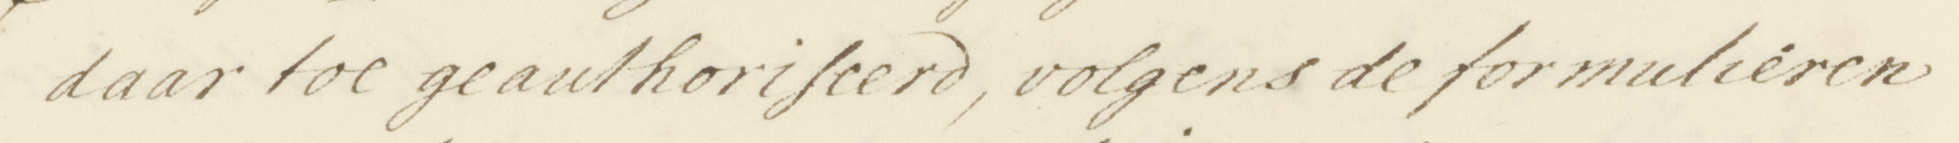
daar toe geauthoriseerd, volgens de formulieren
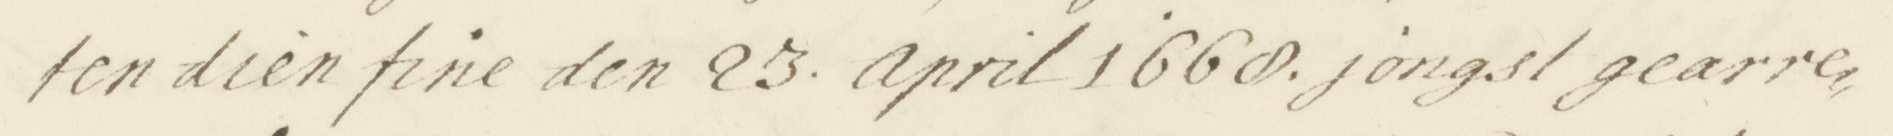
ten dien fine den 23. April 1668 jongst gearre„
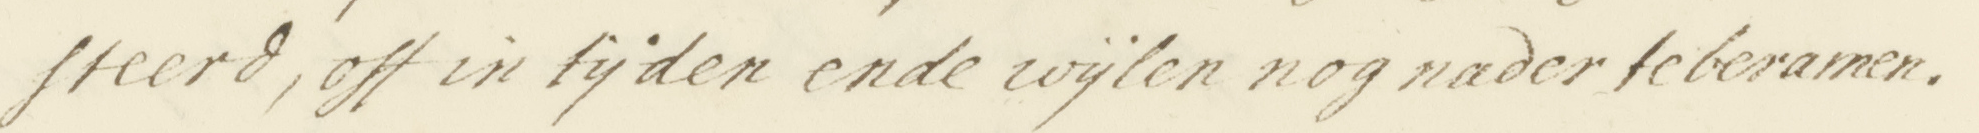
steerd, off in tijden ende wijlen nog nader te beramen.
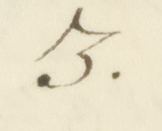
3.
